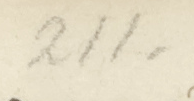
211.
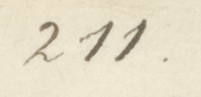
211.
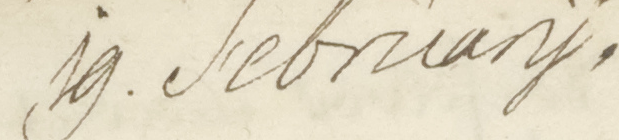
19. Februarij.
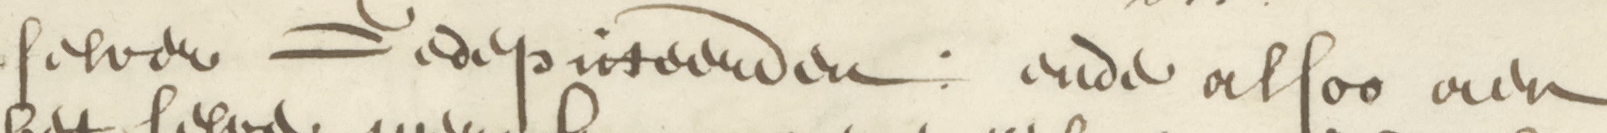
selver Gedeputeerden: ende alsoo aen
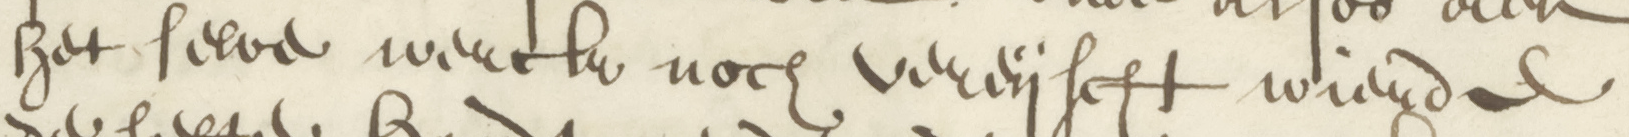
het selve werck noch vereijscht wierde
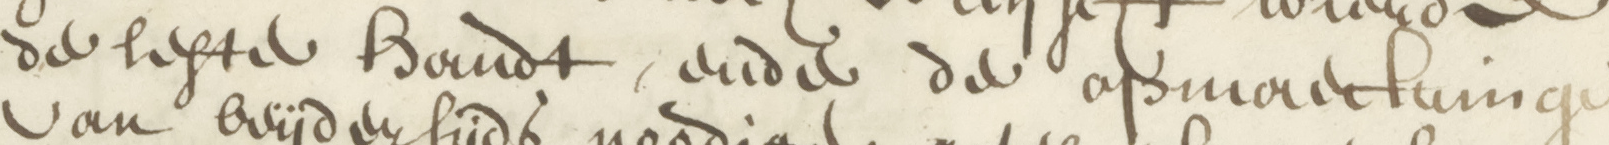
de leste handt, ende de opmaeckinge,
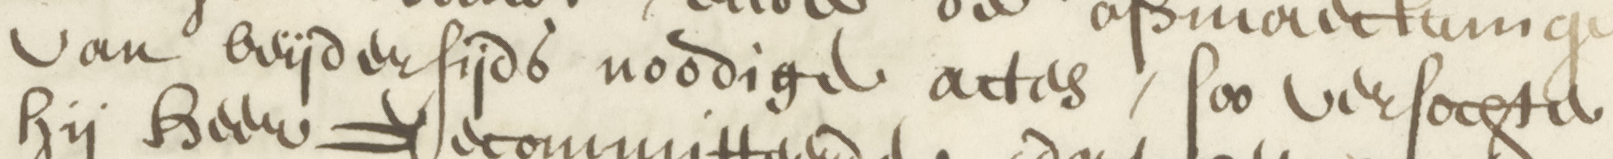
van beijdersijds noodige actes, soo versochte
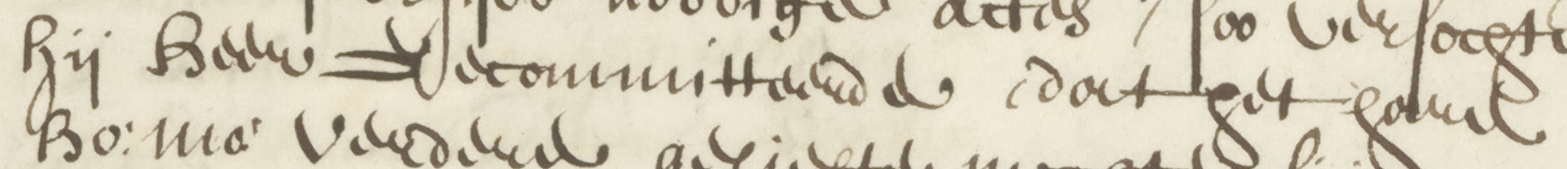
hij heer Gecommitteerde, dat het hare
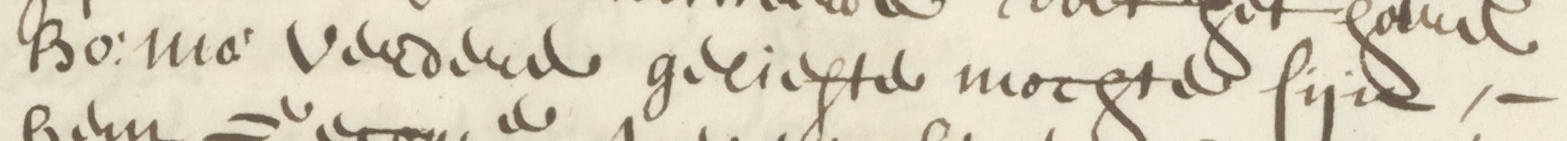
Ho:Mo: verdere geliefte mochte sijn, -
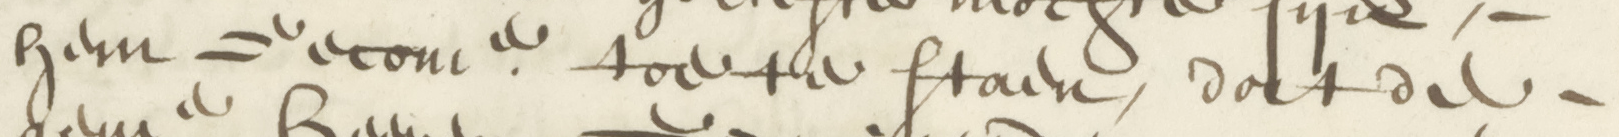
hem Gecome. toe te staen, dat de
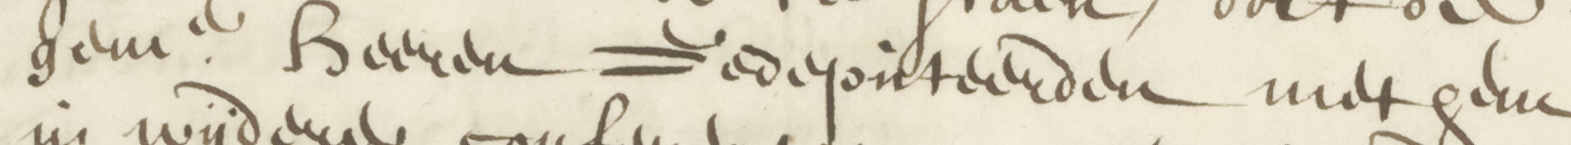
geme. Heeren Gedeputeerden met hem
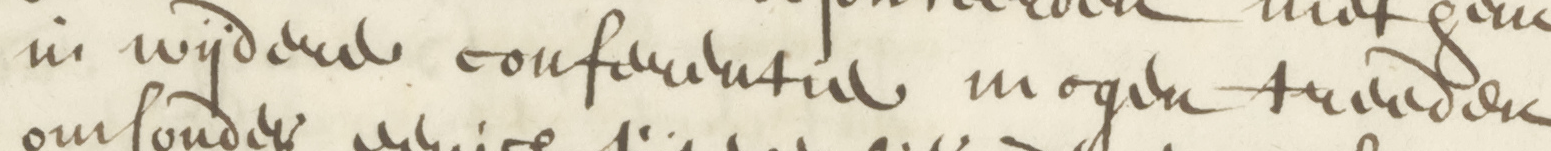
in wijdere conferentie mogen treeden
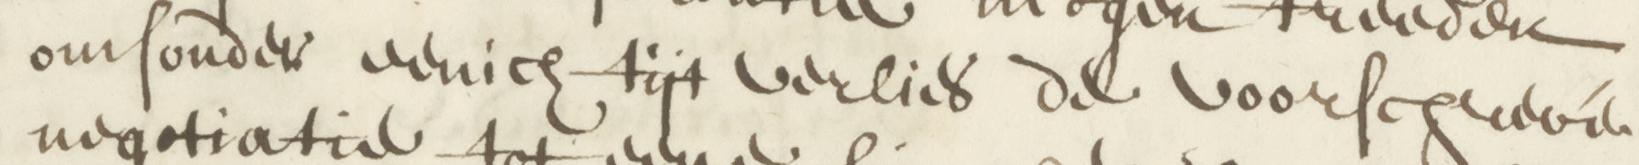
om sonder eenich tijt verlies de voorschreve
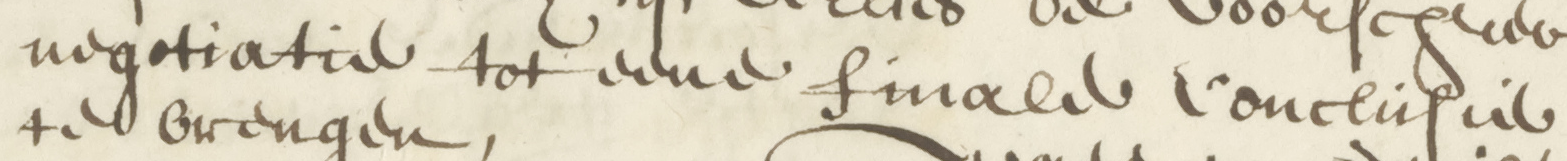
negotiatie tot eene finale Conclusie
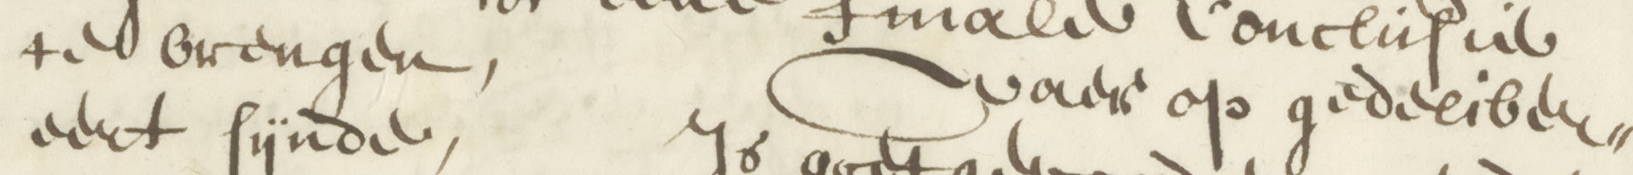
te brengen. Waer op gedeliber„
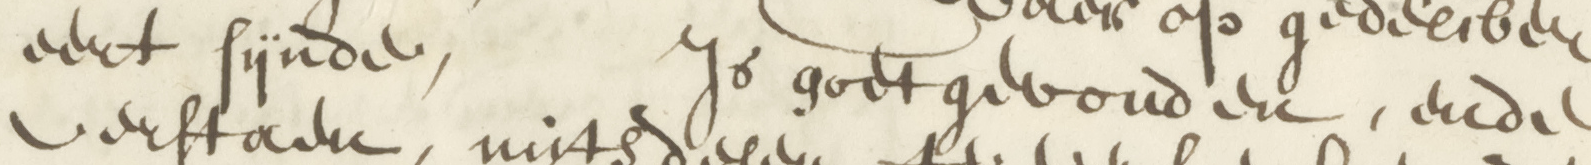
„eert sijnde, Is goetgevonden, ende
